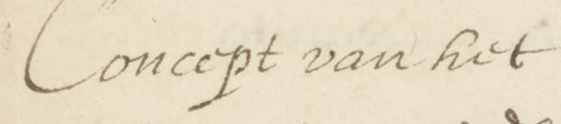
Concept van het
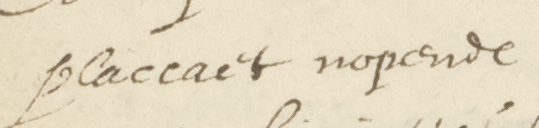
placcaet nopende
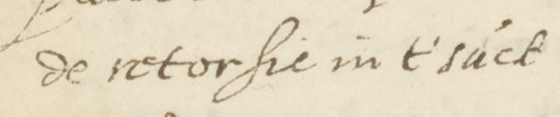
de retorsie in t'suck
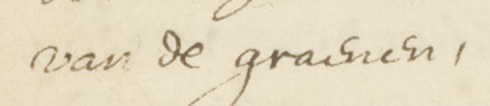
van de graenen.
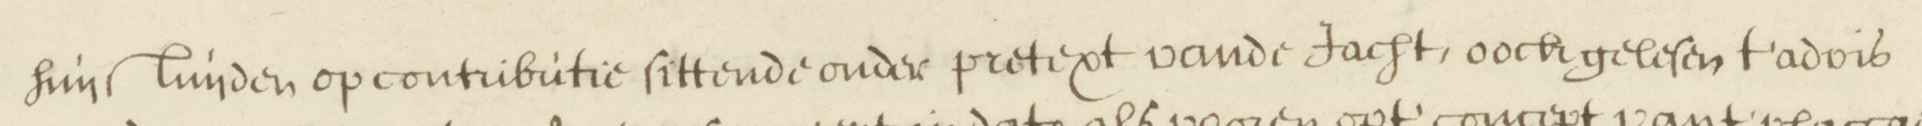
huysluyden op contributie sittende onder pretext vande Jacht, oock gelesen t' advis
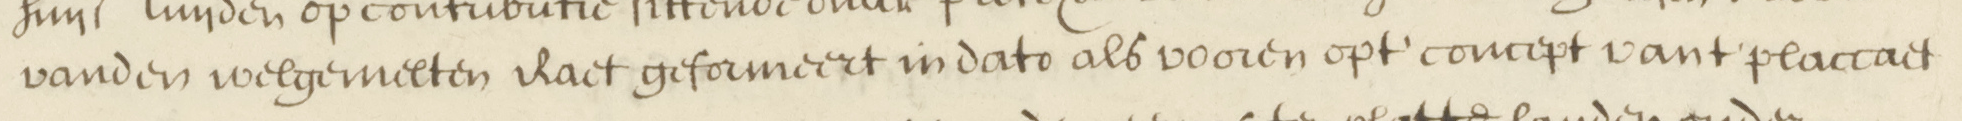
vanden welgemelten Raet geformeert in dato als vooren opt' concept vant' placcaet
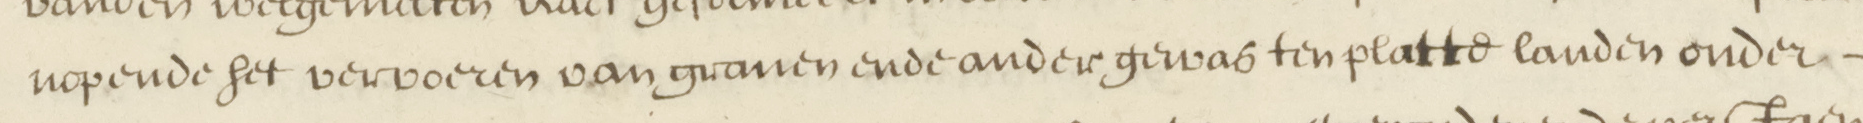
nopende het vervoeren van granen ende ander gewas ten platte landen onder
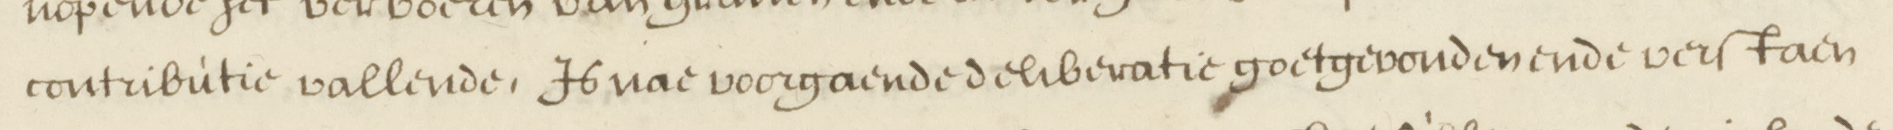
contributie vallende. Is nae voorgaende deliberatie goetgevonden ende verstaen
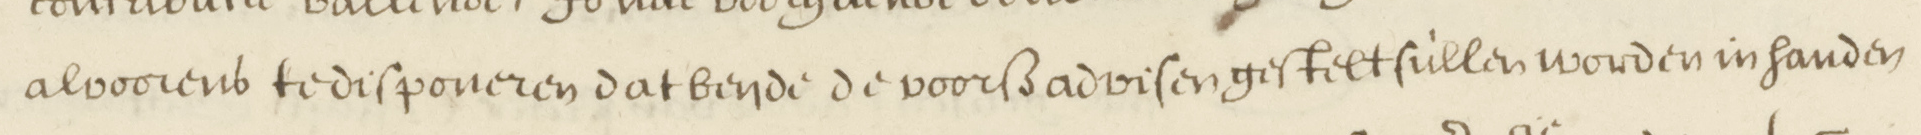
alvoorens te disponeren dat beyde de voors advisen gestelt sullen worden in handen
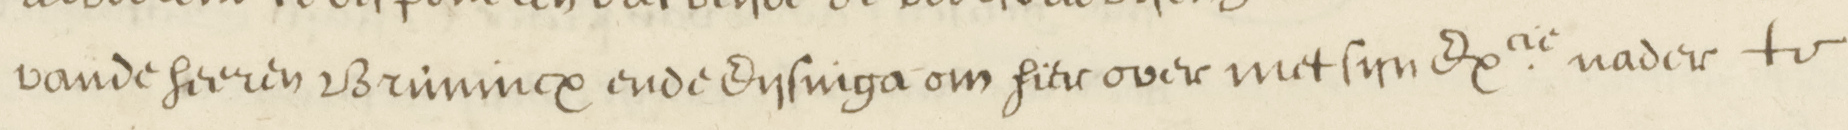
vande heeren Brunincx ende Eysinga om hier over met syn Excie. nader te
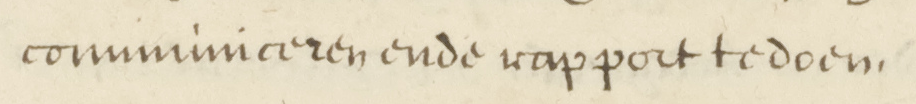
communiceren ende rapport te doen.
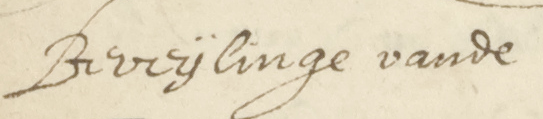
Beveijlinge vande
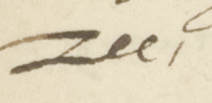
Zee.
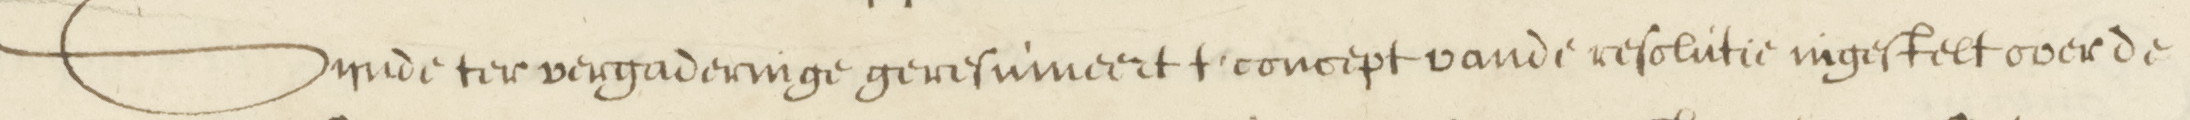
Synde ter vergaderinge geresumeert t'concept vande resolutie ingestelt over de
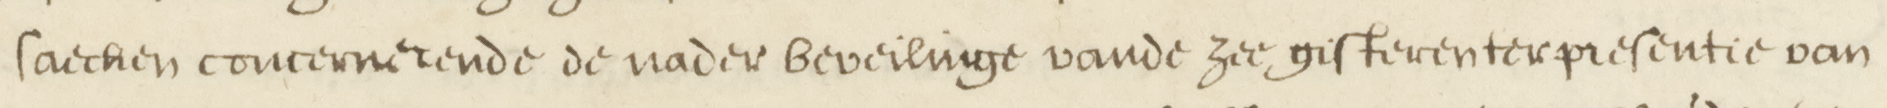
saecken concernerende de nader beveilinge vande zee gisteren ter presentie van
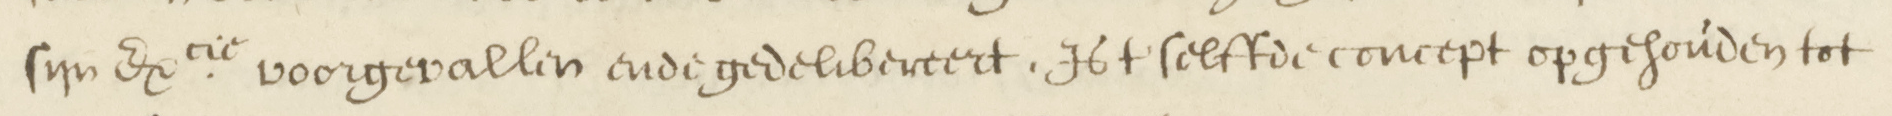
syn Excie. voorgevallen ende gedelibereert. Is t' selffde concept opgehouden tot
